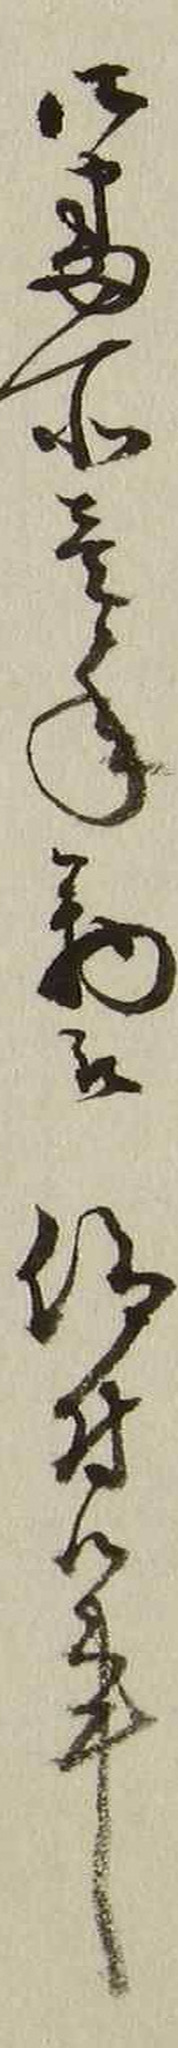御番所壱年勤被仰付候事
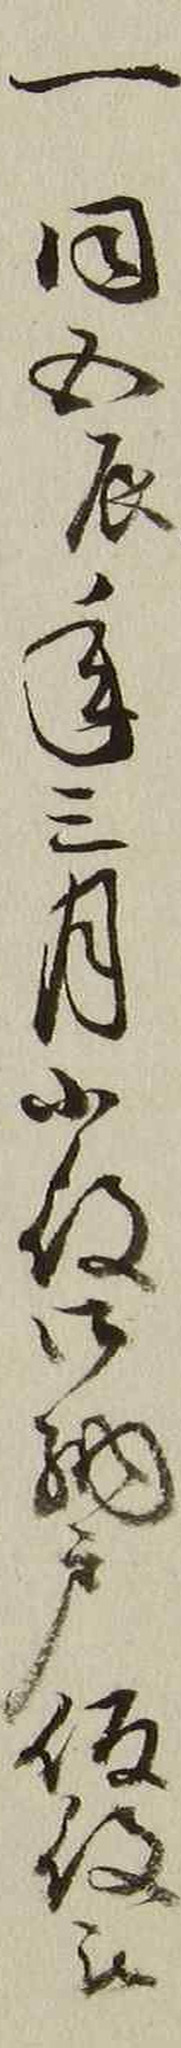一同五辰年三月小役御納戸仮役被
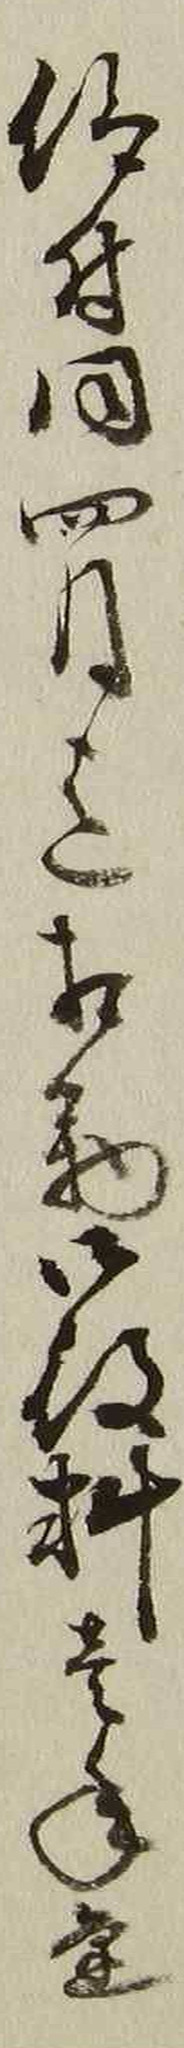仰付同四月迄相勤御役料壱年金
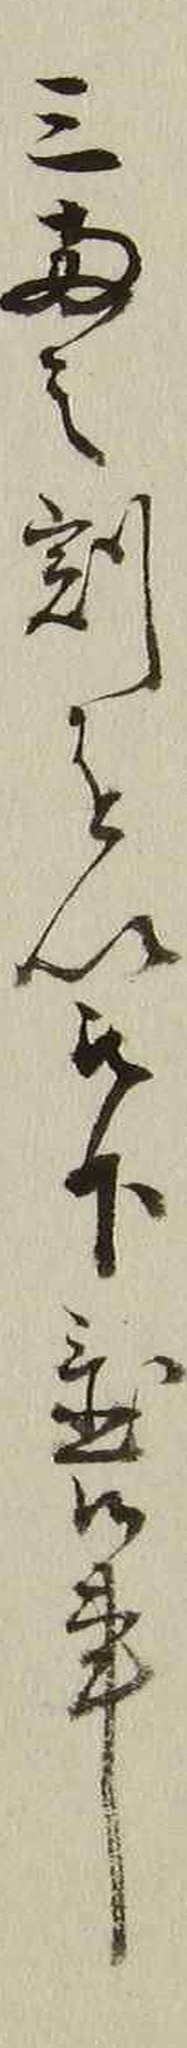三両之割を以被下置候事
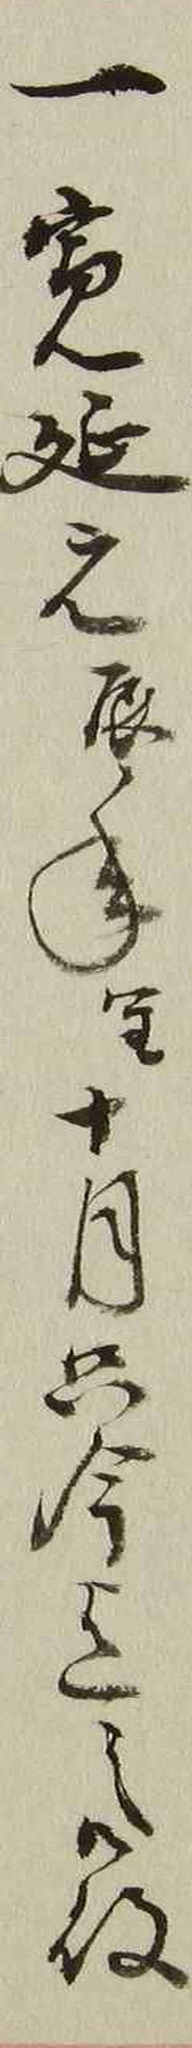一寛延元辰年閏十月只今迄之御役
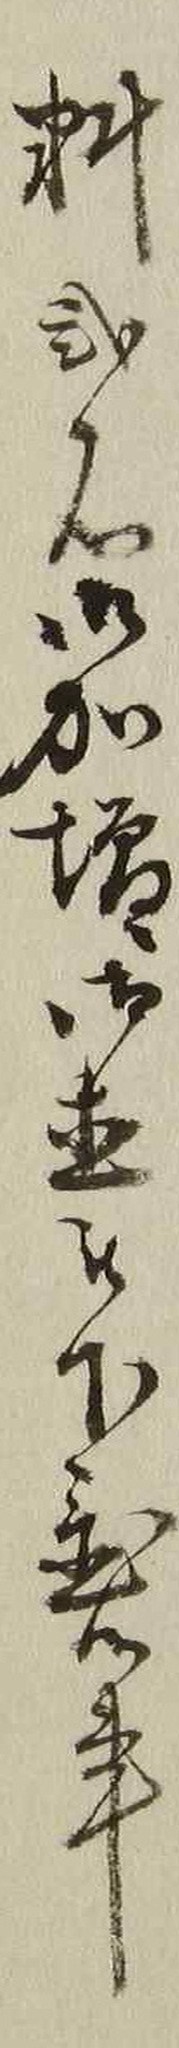料弐石御加増ニ御直被下置候事
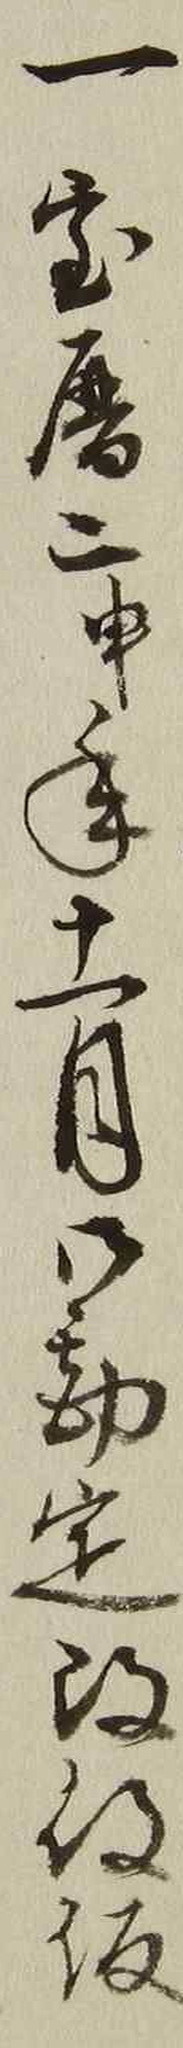一宝暦二申年十一月御勘定改役刈
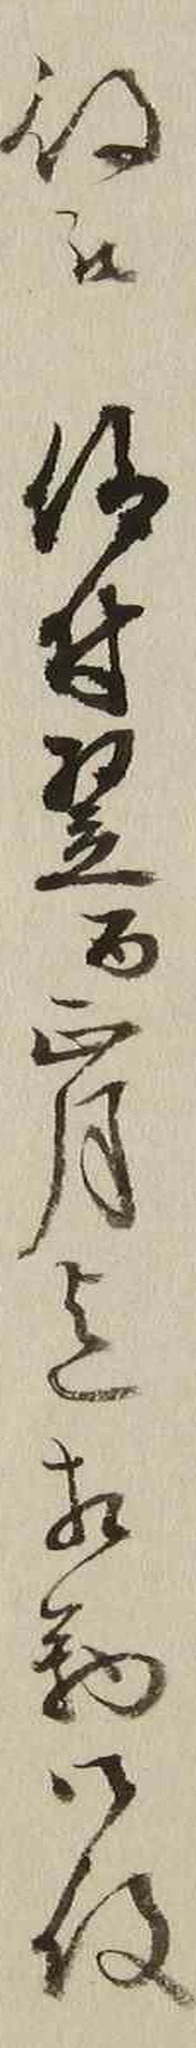役被仰付翌酉正月迄相勤候役
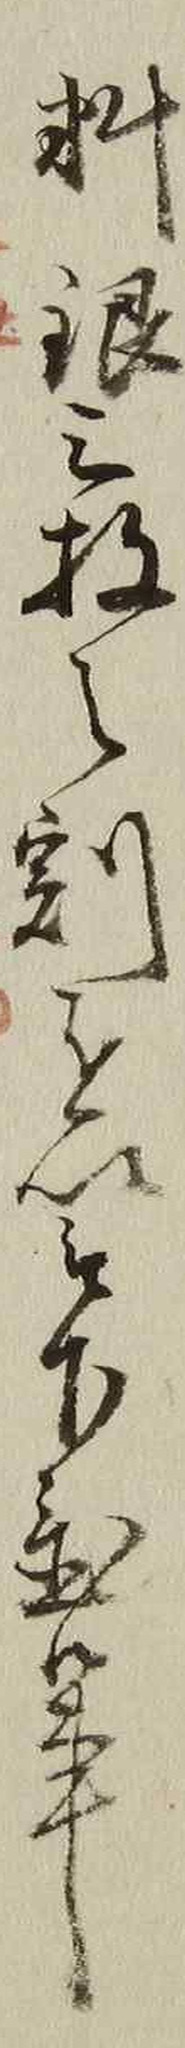料銀三枚之割を以被下置候事
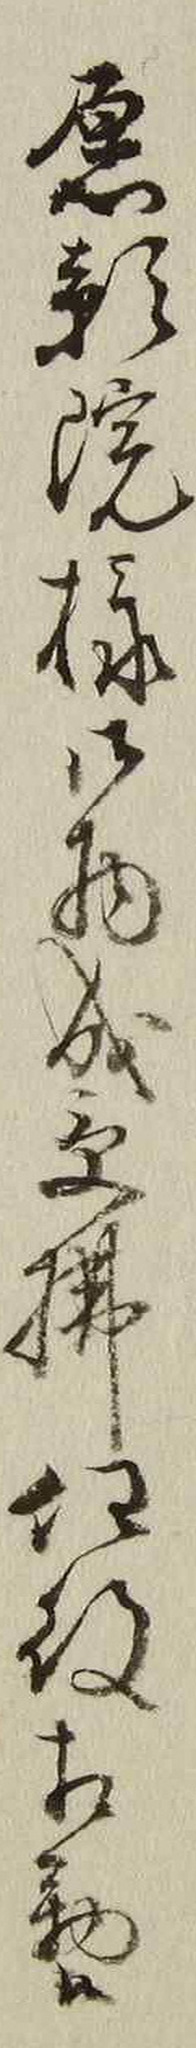愿彰院様御物成受払任役相勤候
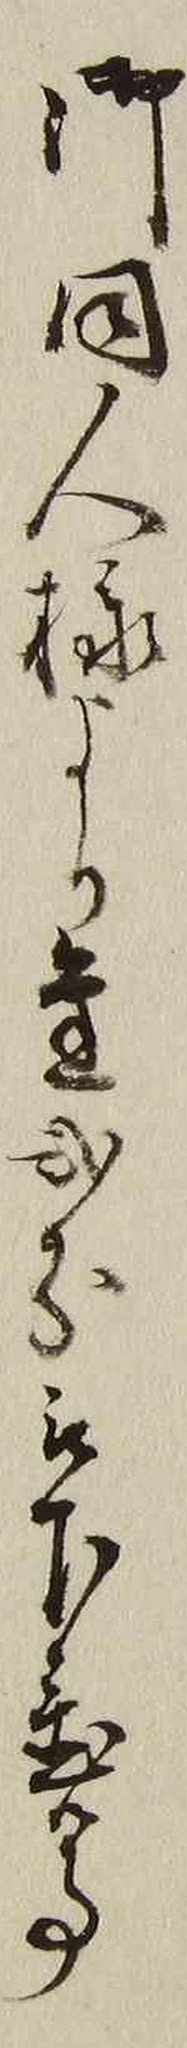御同人様より金弐分被下置候事
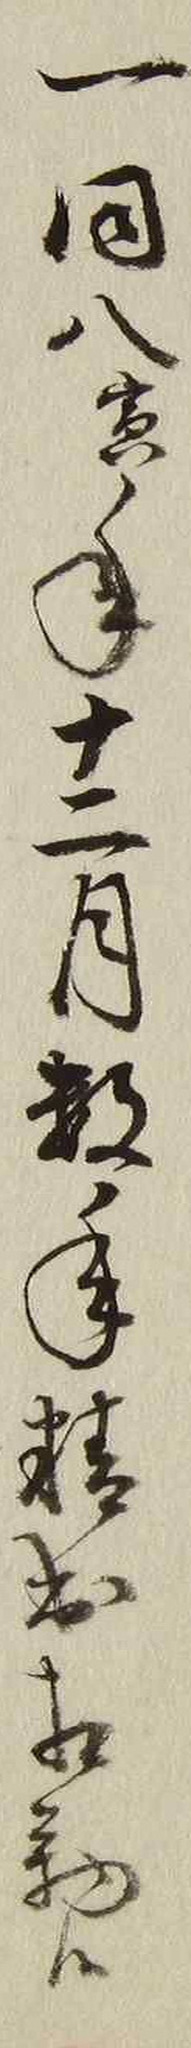一同八寅年十二月数年精出相勤候
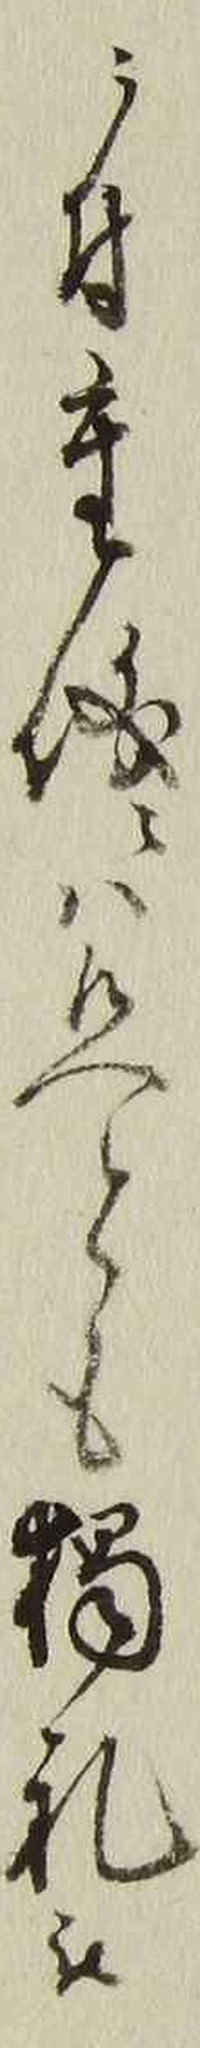ニ付重儀ニは候へとも独礼被
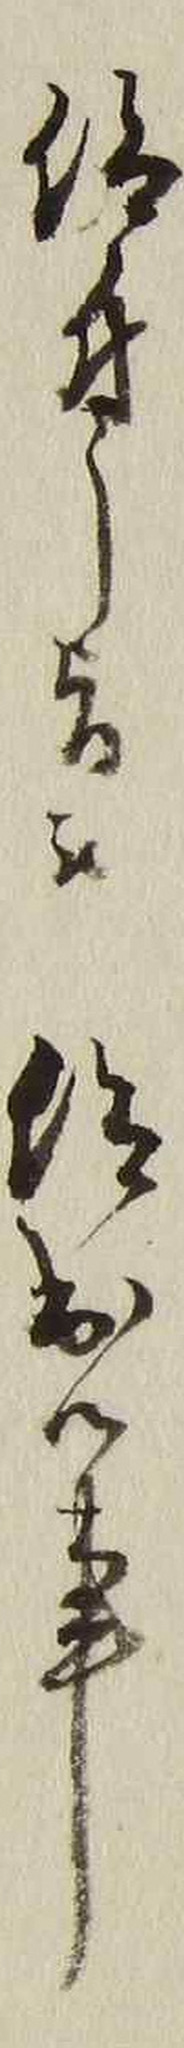仰付之旨被仰出候事
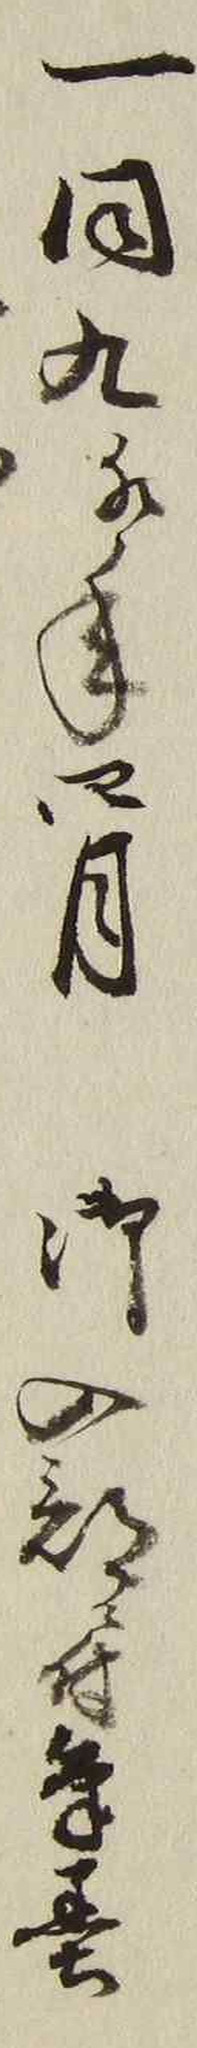一同九卯年四月御入部ニ付ニ筆墨
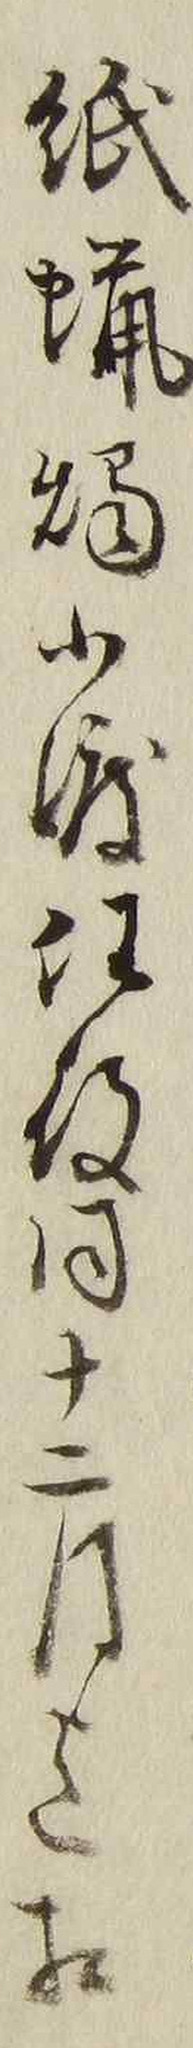紙蝋燭小渡任役同十二月迄候相
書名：諸士系譜　巻之36　は之部4
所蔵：会津若松市立会津図書館
